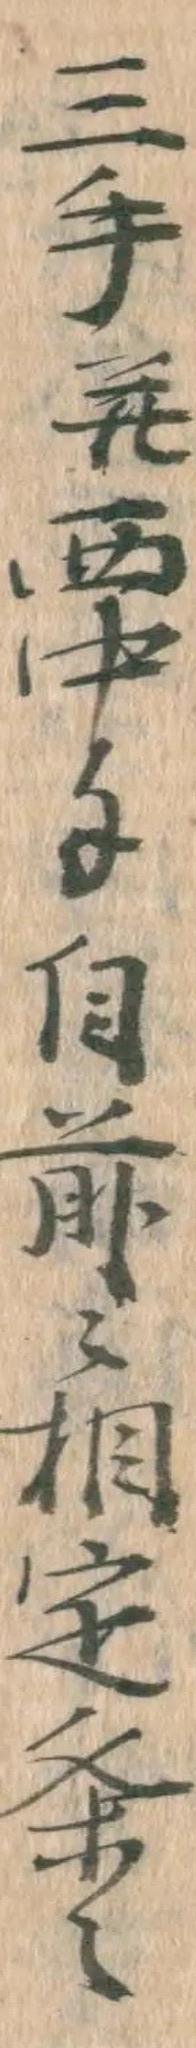三手并西中手自前〻相定条〻
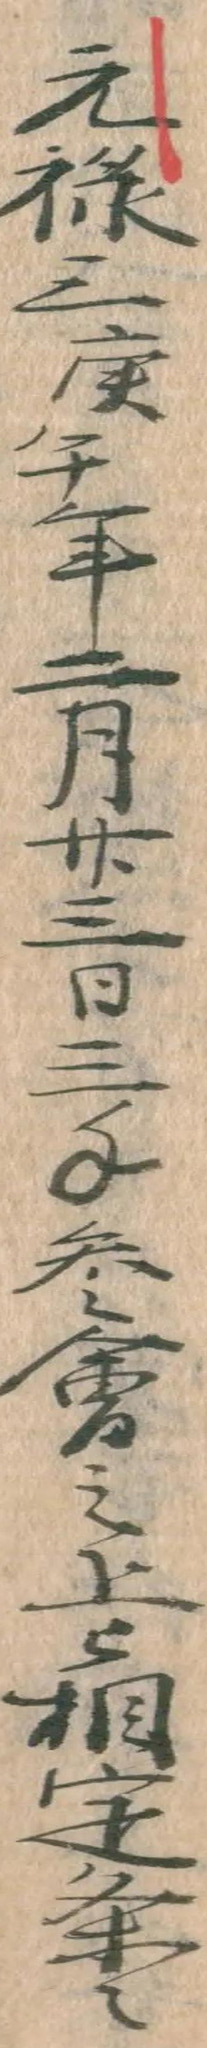元禄三庚午年二月廿三日三手参會之上被相定条々
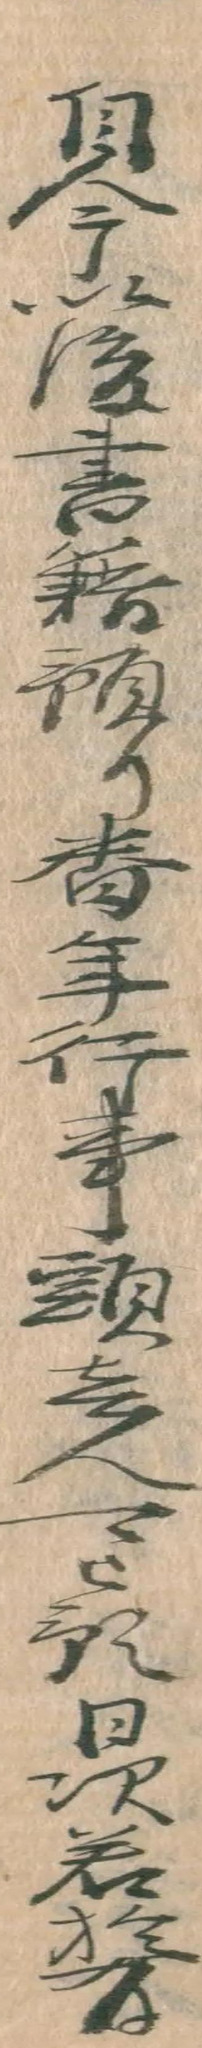一自今以後書籍預り番年行事頭壱人可被預日次若於有
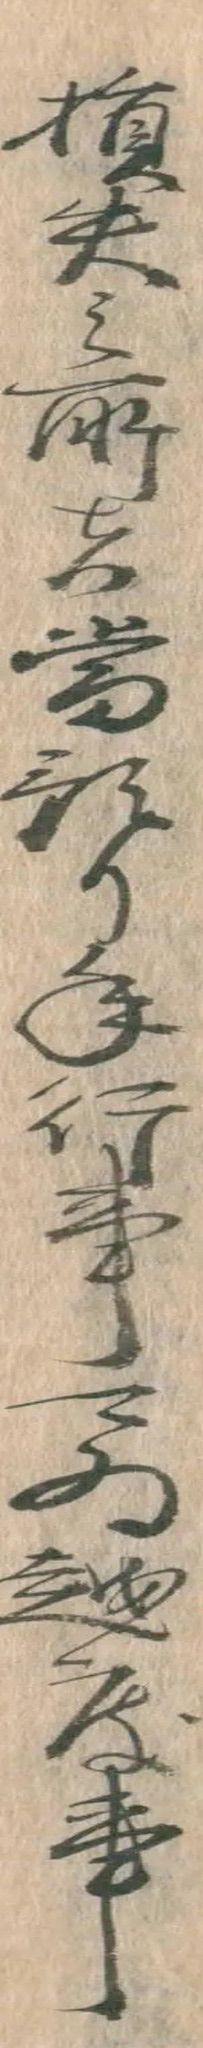損失之所は當預り年行事可為越度事
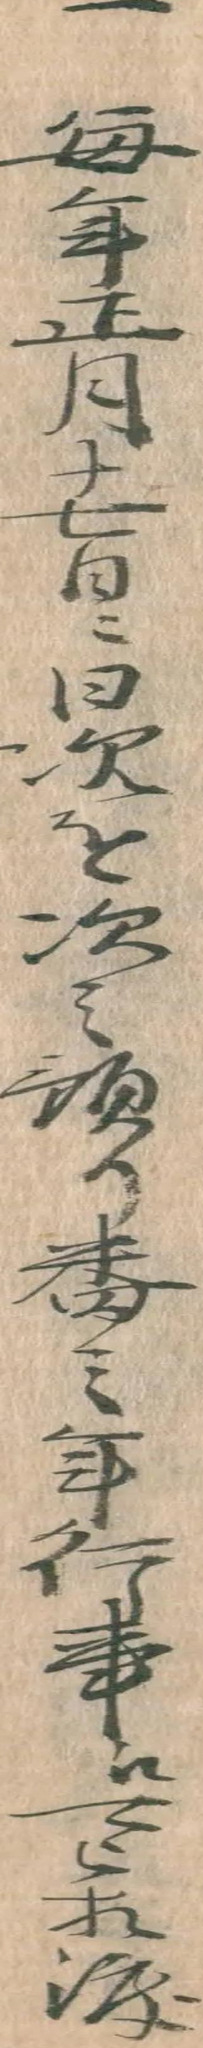一毎年正月十七日ニ日次を次之預り番之年行事江可被相渡
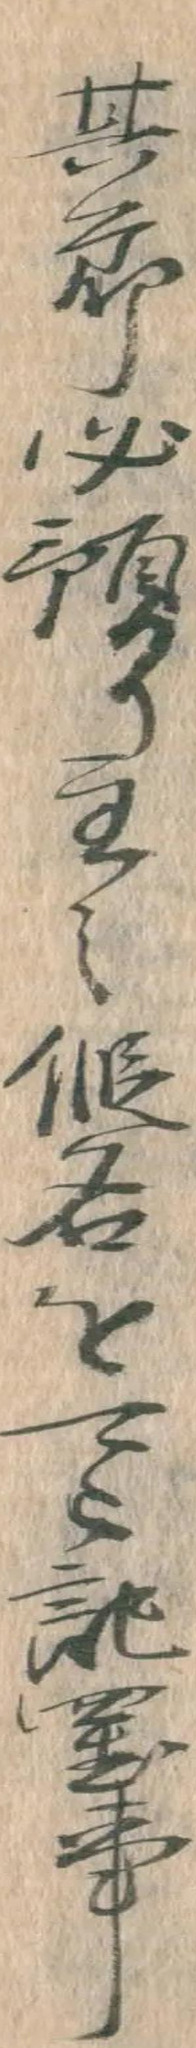其節必預り主之仮名を可被記置事
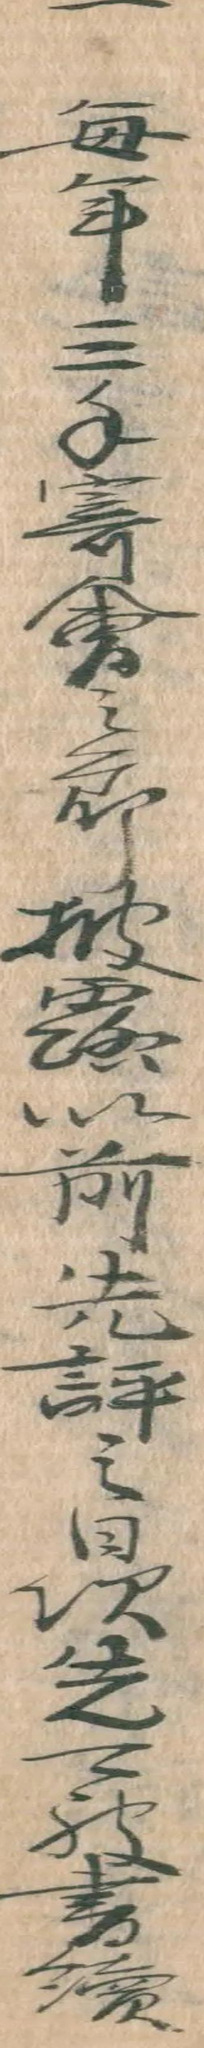一毎年三手寄會之節披露以前先評之日次先可被書續
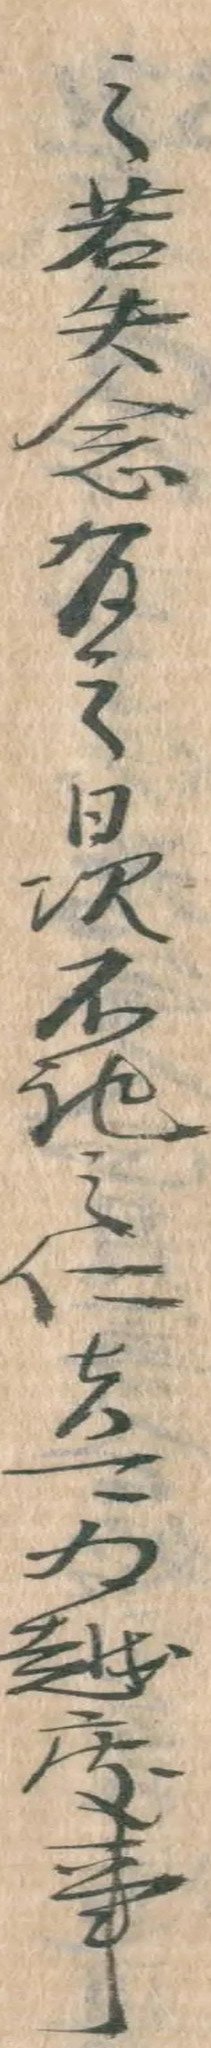之若失念有之日次不記之仁者可為越度事
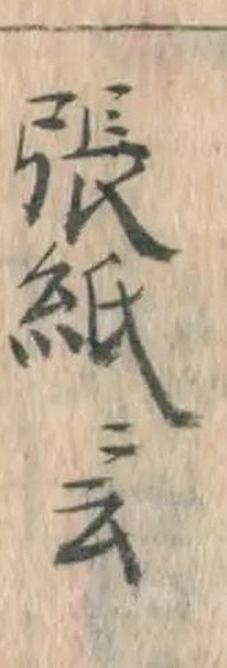張紙ニ云
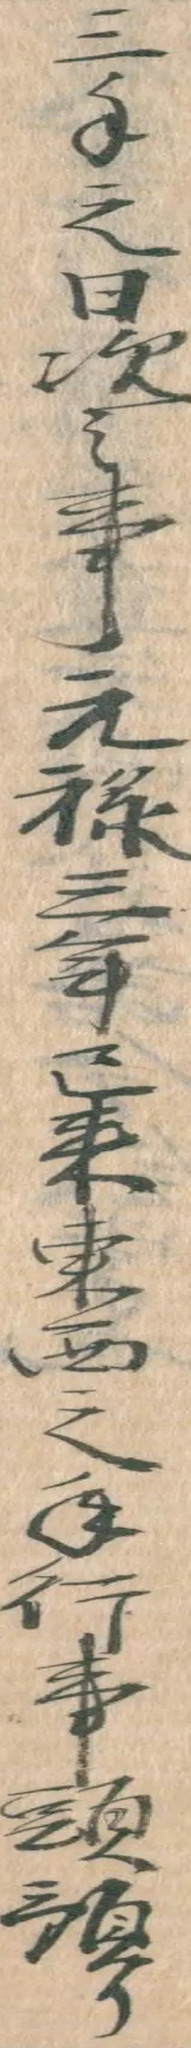三手之日次之事元禄三年已来東西之年行事頭預り
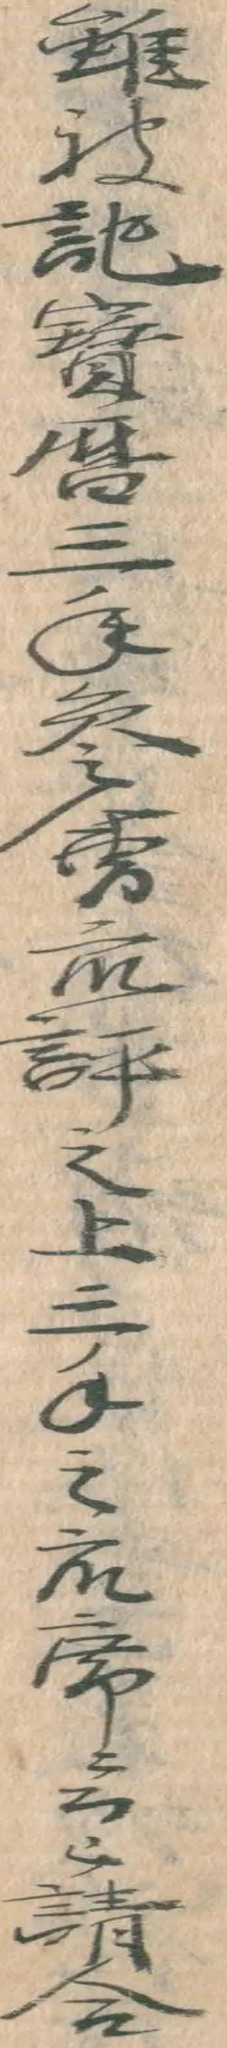雖被記寶暦三年参會衆評之上三手之衆席ニ而被請合
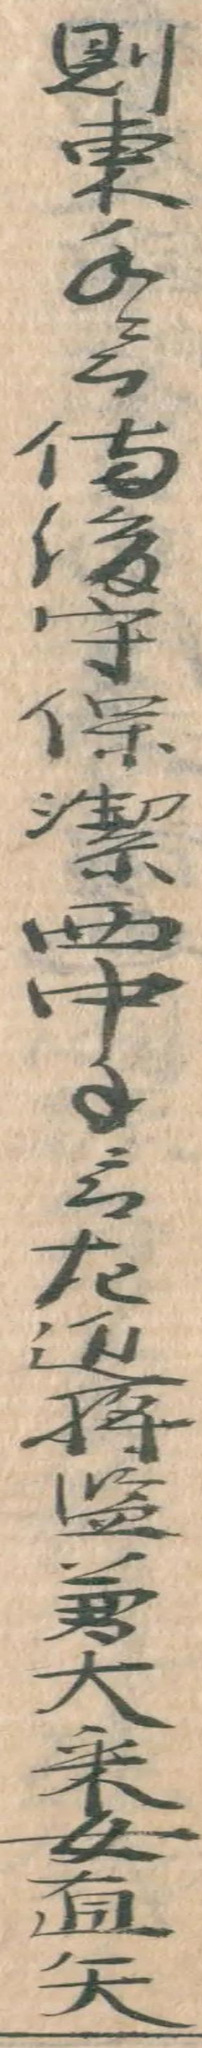則東手ニ而備後守保潔西中手ニ而左近将監兼大采女直矢

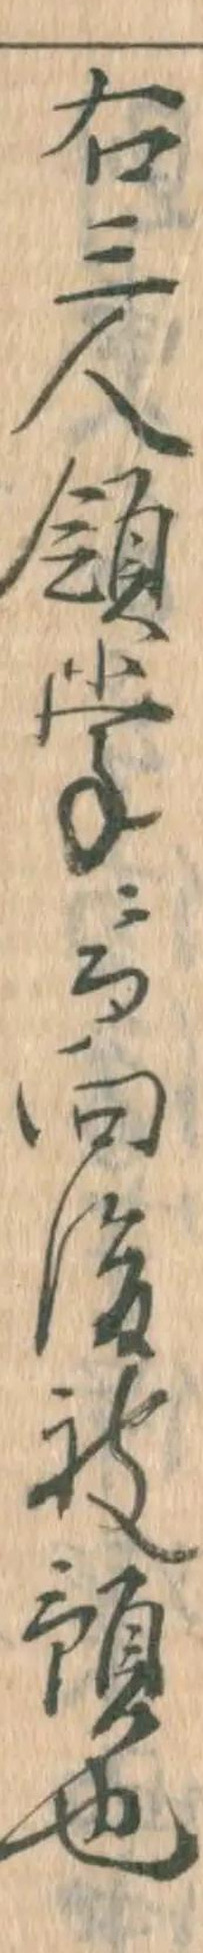右三人領掌ニ而向後被預也
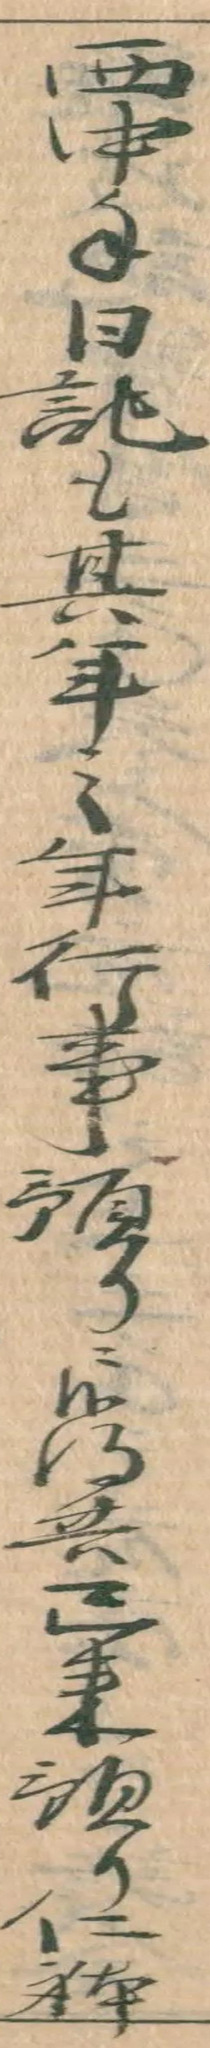西中手日記も其年之年行事預りニ候得共已来預り仁躰
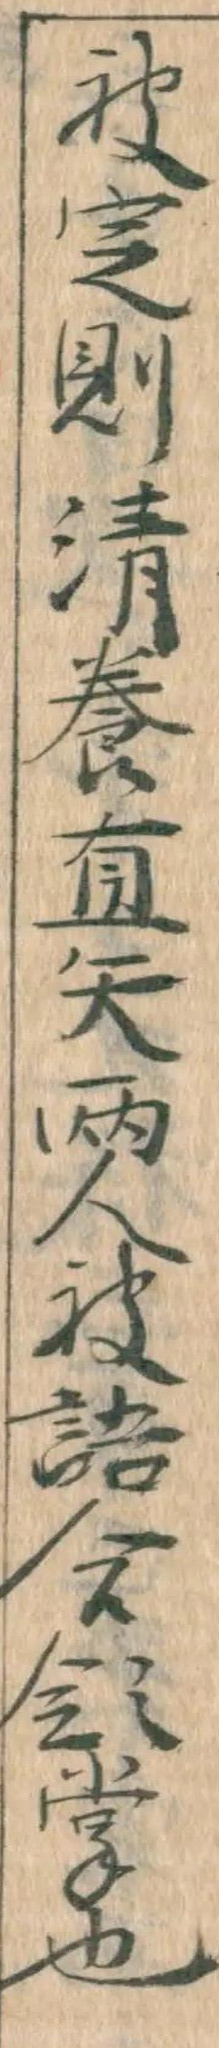被定則清養直矢両人被語合領掌也
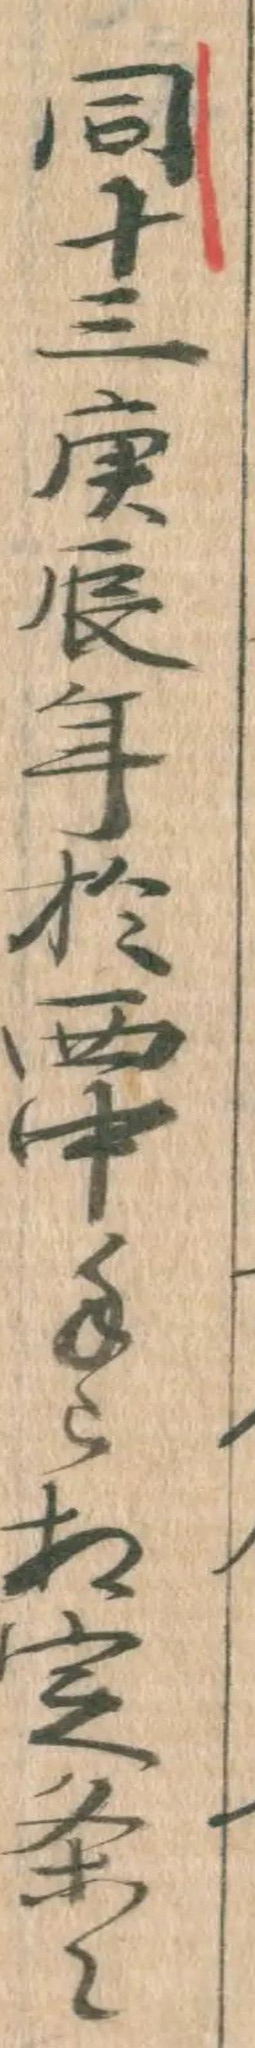同十三庚辰年於西中手被相定条々
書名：賀茂社記録. 第29冊
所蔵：国立国会図書館 National Diet Library, JAPAN
